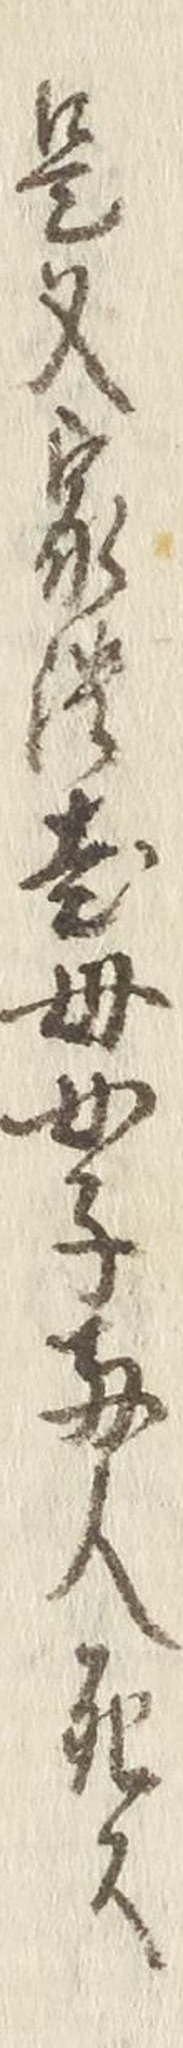是又家潰老母女子両人死ス
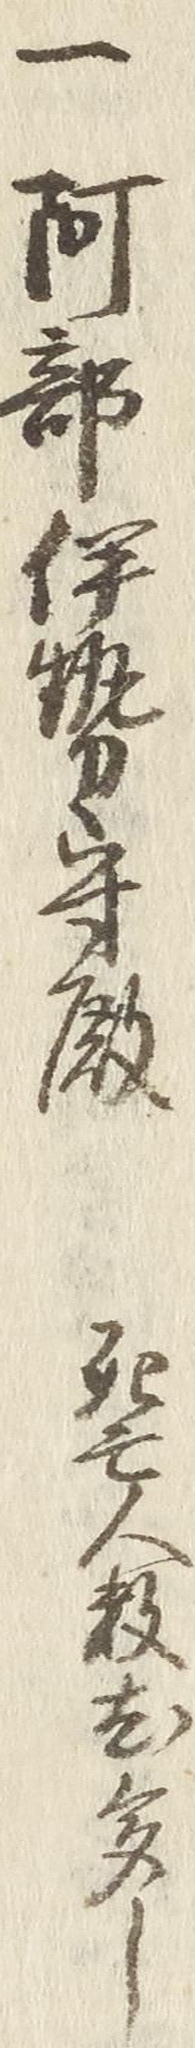一阿部伊勢守殿死亡人数尤多し
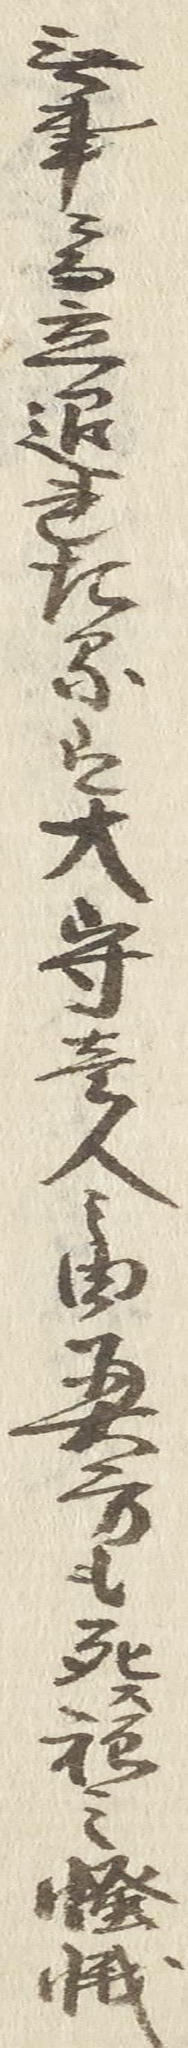無事二而立退れたるは大守壱人之由奥方も死ス程之怪我
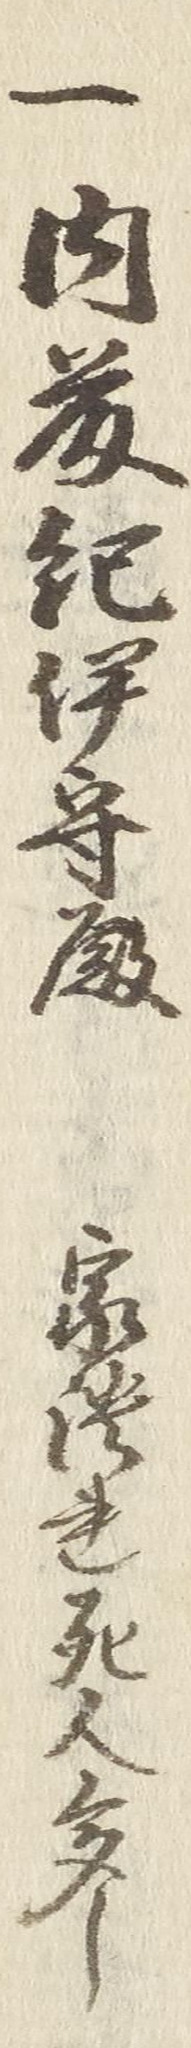一内藤紀伊守殿家潰れ死人多し
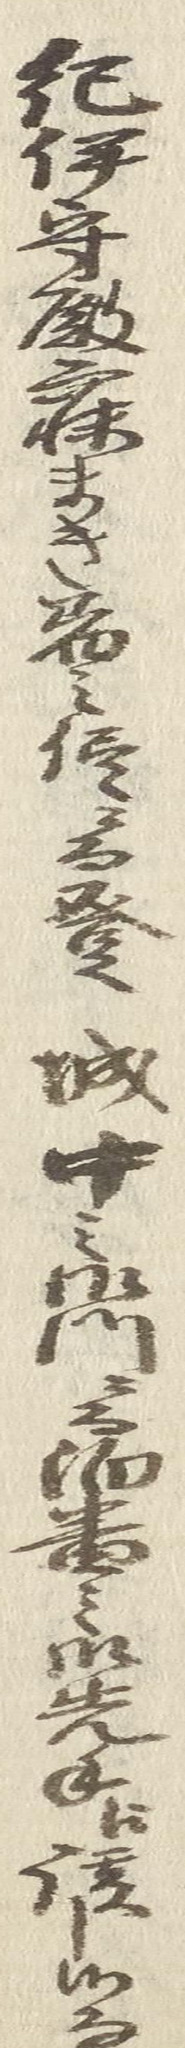紀伊守殿寝まき着之侭二而登城中之御門二而泊番之御先手江談し候而

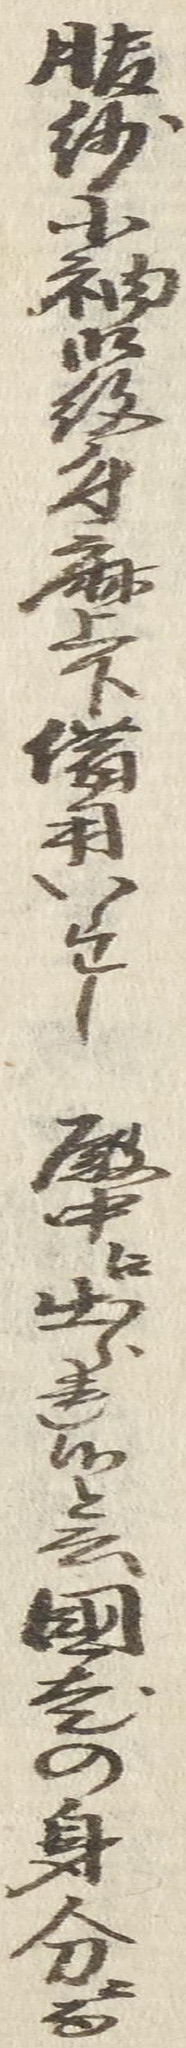服紗小袖御役付麻上下借用いたし殿中江出られ候と云国老の身分二而
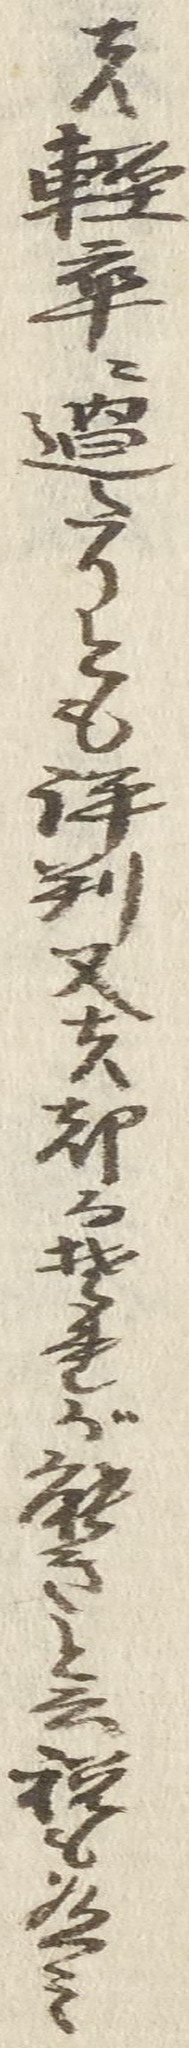は軽卒二過たりとも評判又は却而それが能きと云説も有之
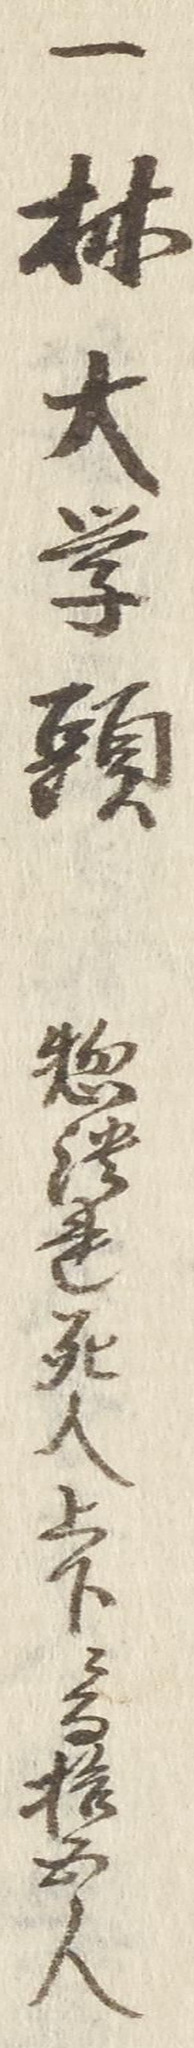一林大学頭惣潰れ死人上下二而拾五人
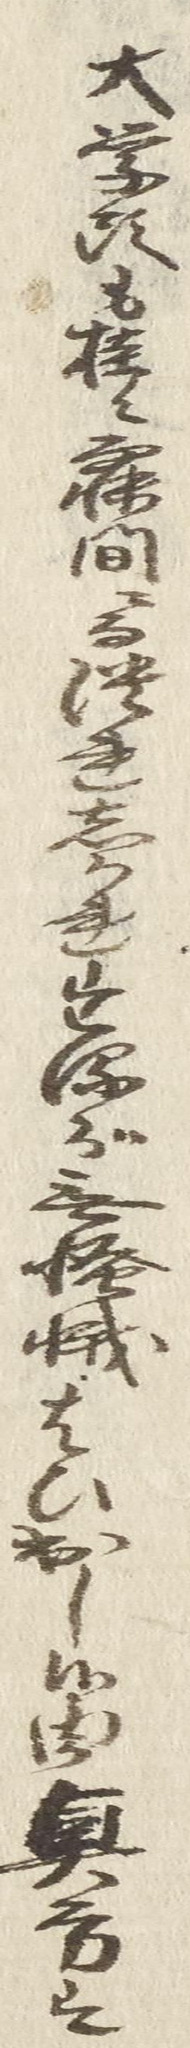大学頭も桂之寝間二而潰れしかれするが無怪我はひ出し候由奥方は
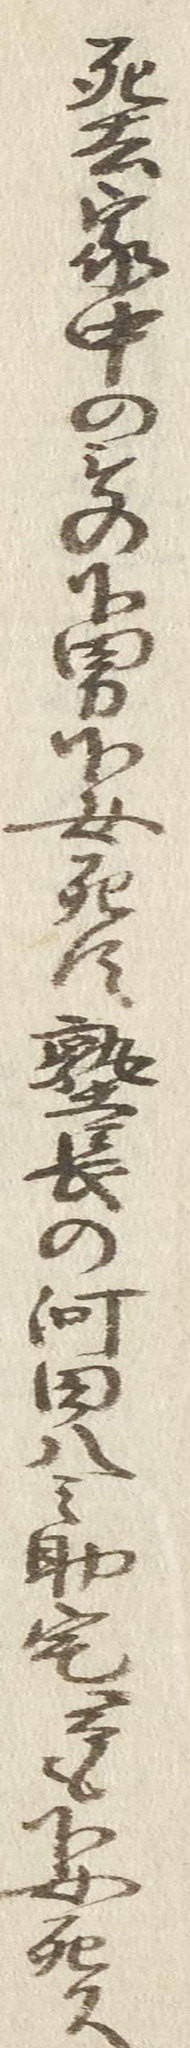死去家中のもの下男下女死す塾長の何田八之助宅二而も下女死う
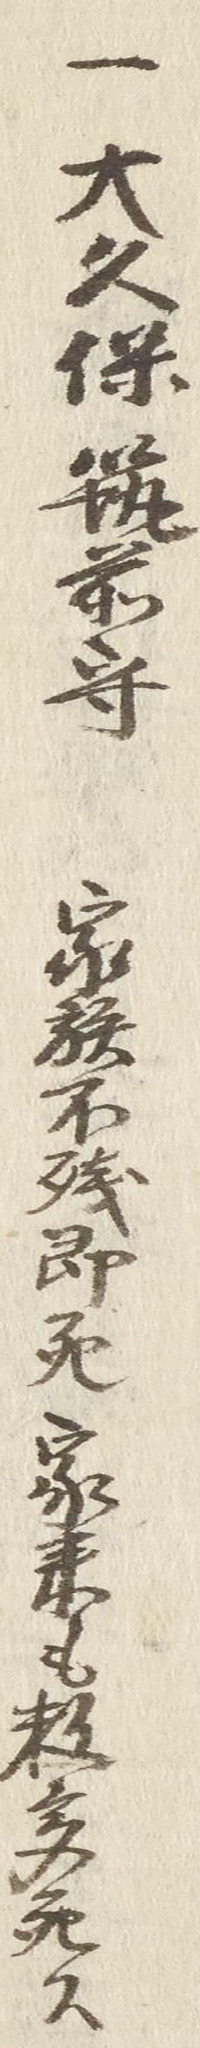一大久保筑前守家族不残即死家来も数多死ス
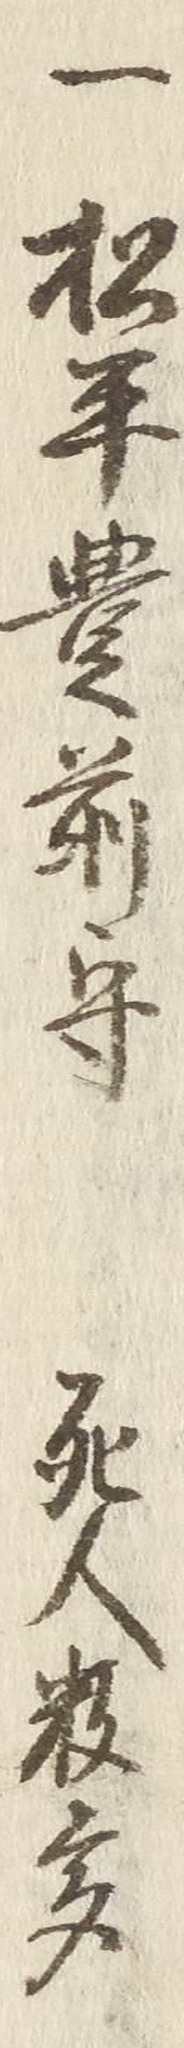一松平豊前守死人数多
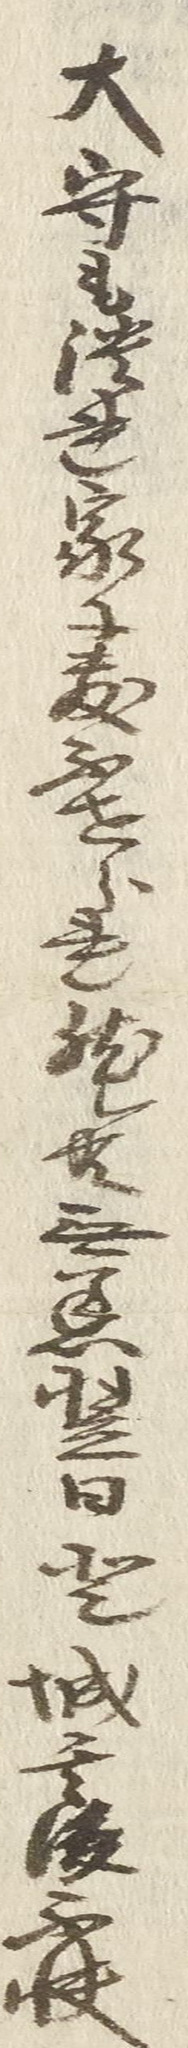大守も潰れ家に敷ふけられ然レ共無恙翌日登城其後不快
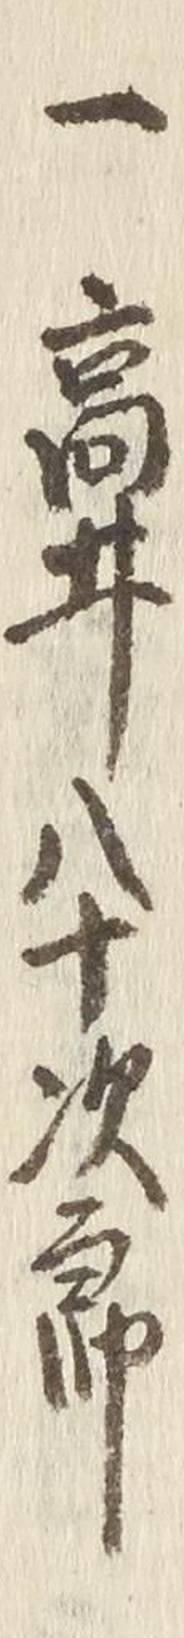一高井八十次郎
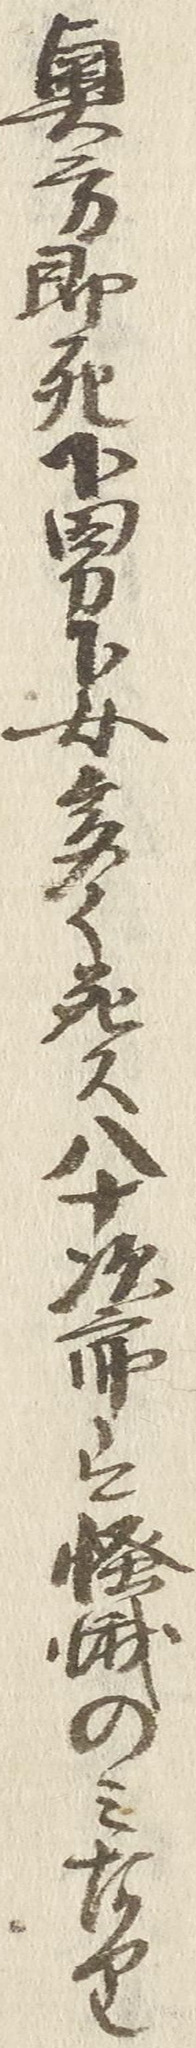奥方即死下男下女多く死ス八十次郎は怪我のみなり
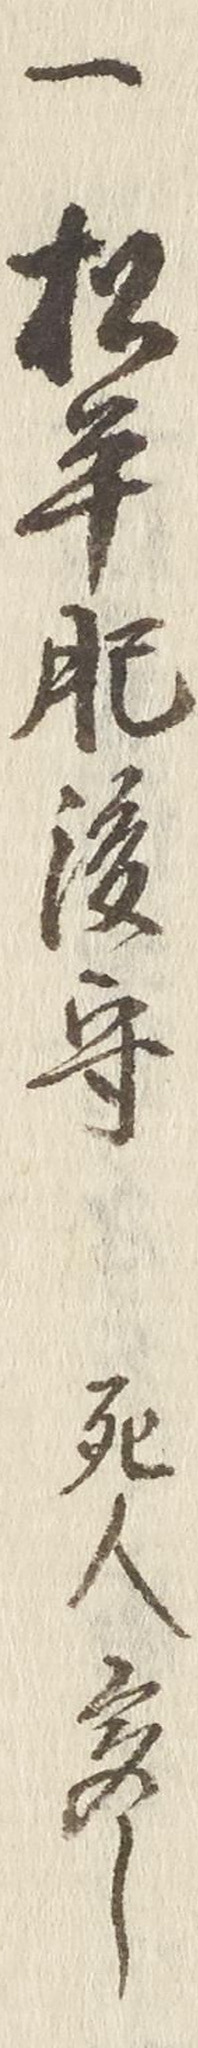一松平肥後守死人多し
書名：従往古地震御届書記誌之一
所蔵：東京大学地震研究所図書室 Earthquake Research Institute Library, The University of Tokyo, JAPAN
